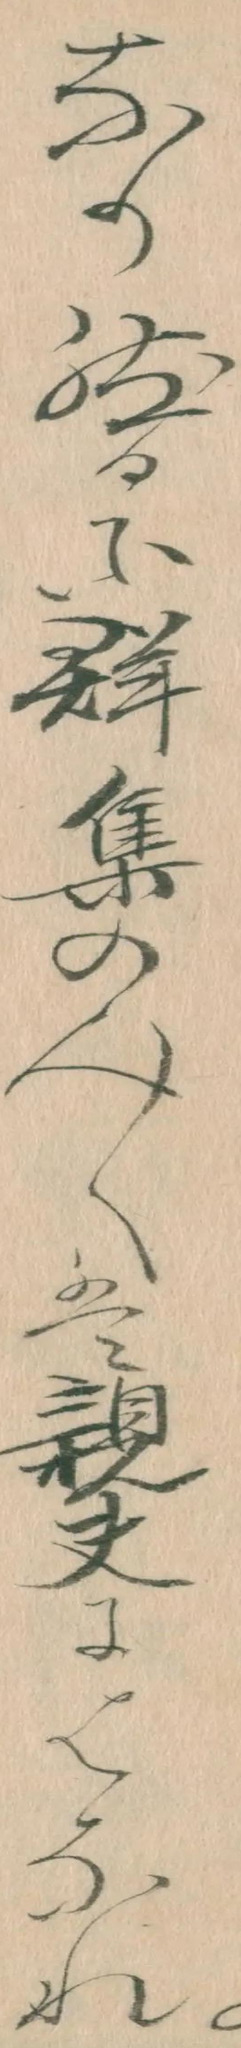なり然るに群集の人〳〵は親夫にはなれ
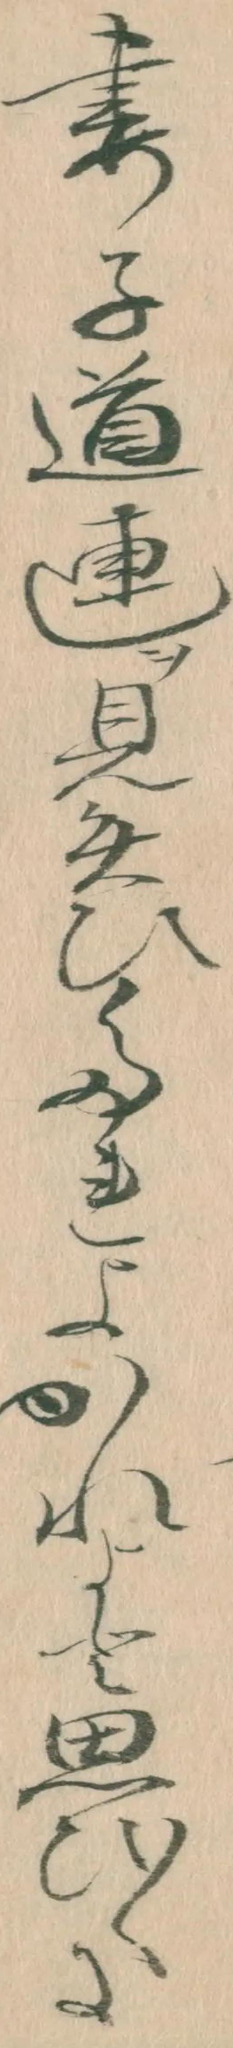妻子道連ヲ見失ひたれよかれよと思ひ〳〵に
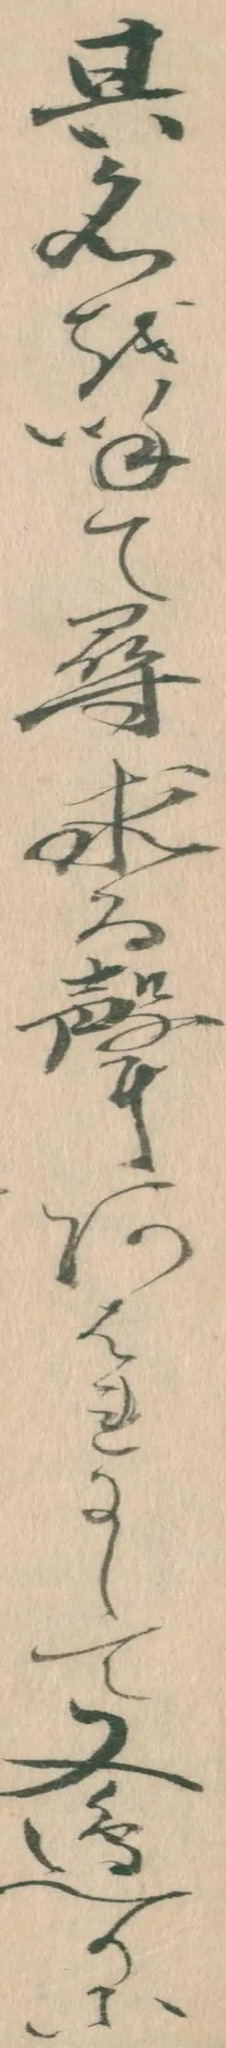其名を呼て尋求る声あはれにして又辺りに
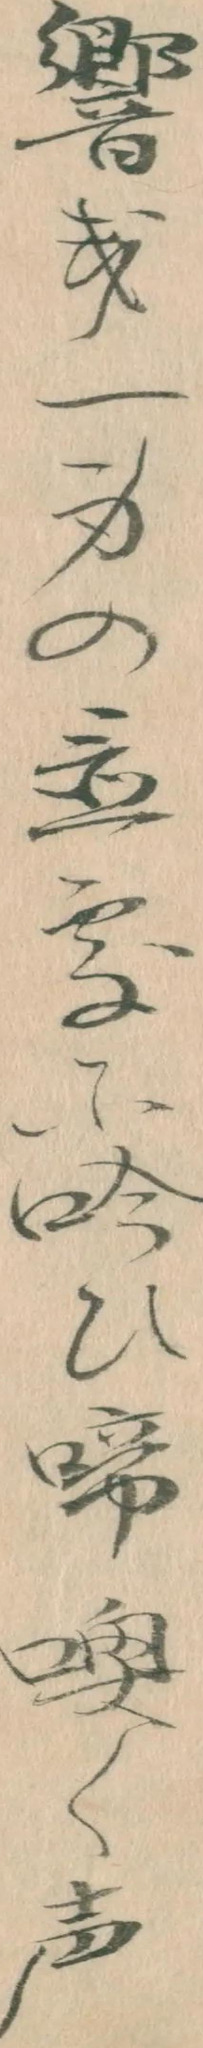響き一身の置処に吟ひ啼喚く声
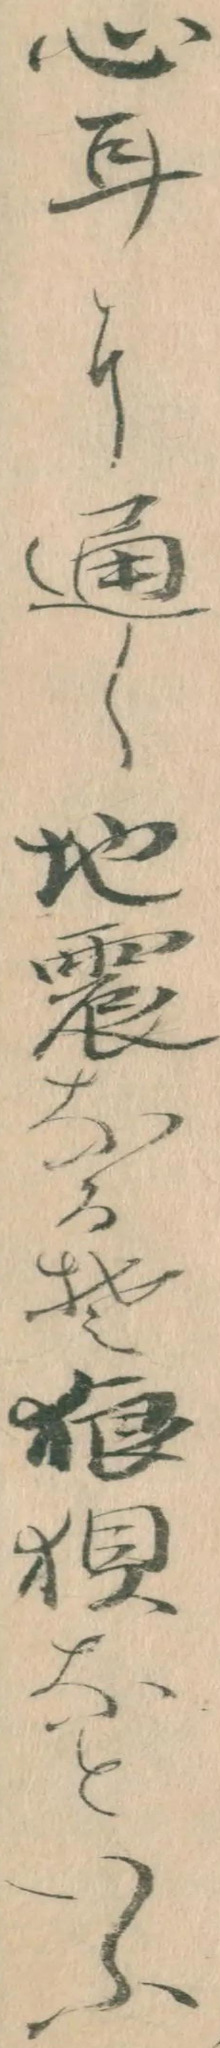心耳に通し地震なるそ狼狽なといふ

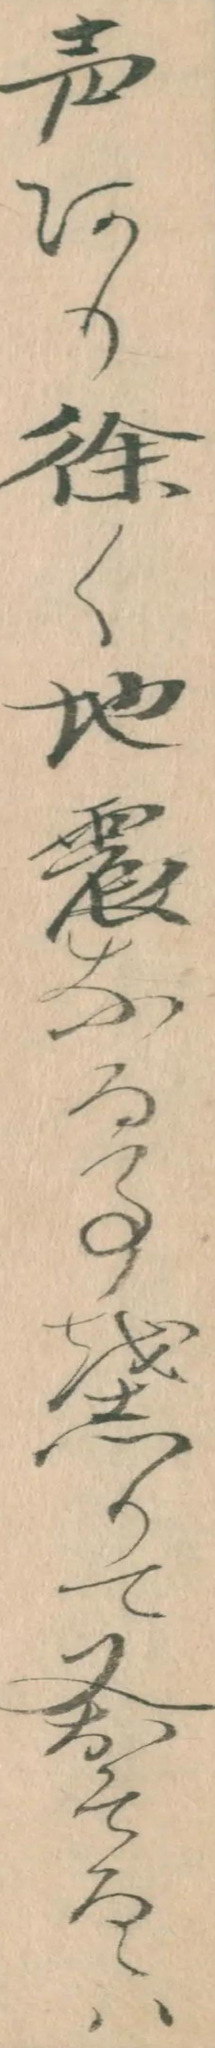声あり徐〳〵地震なる事をしりて又なそるゝは
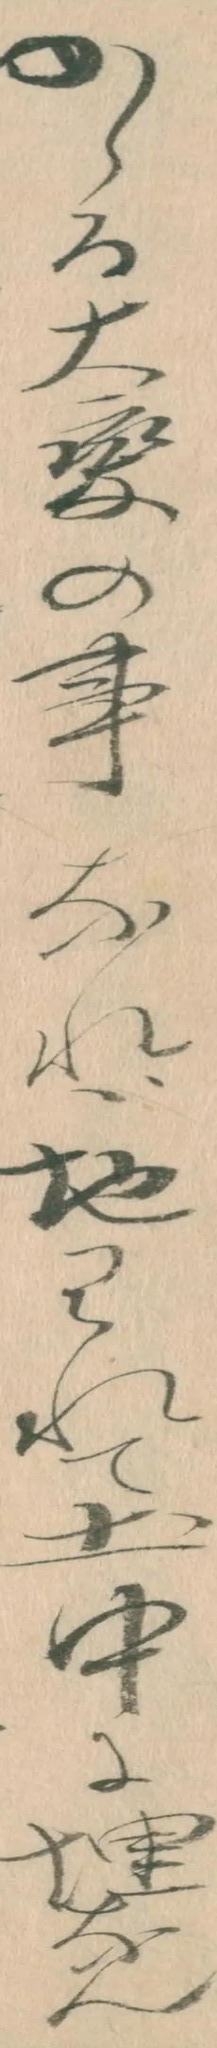かゝる大変の事なれは地われて土中に埋なん
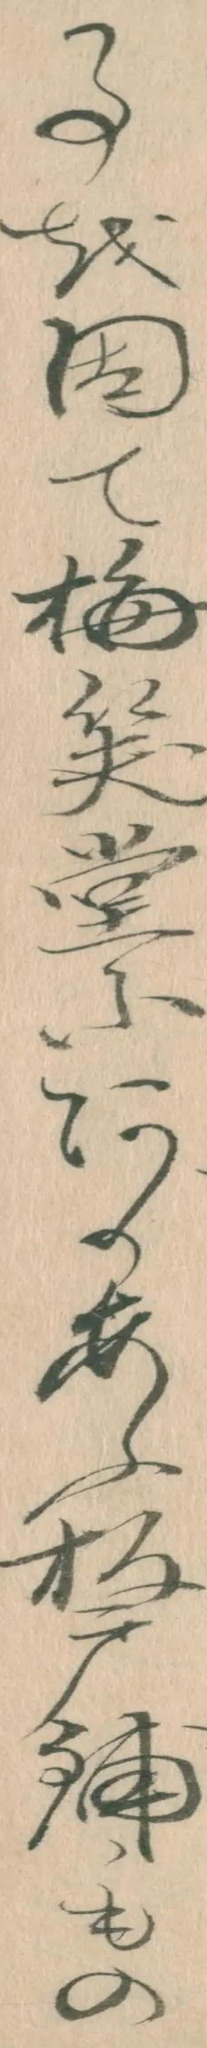事を因て梅笑堂にありあふ板戸鋪もの
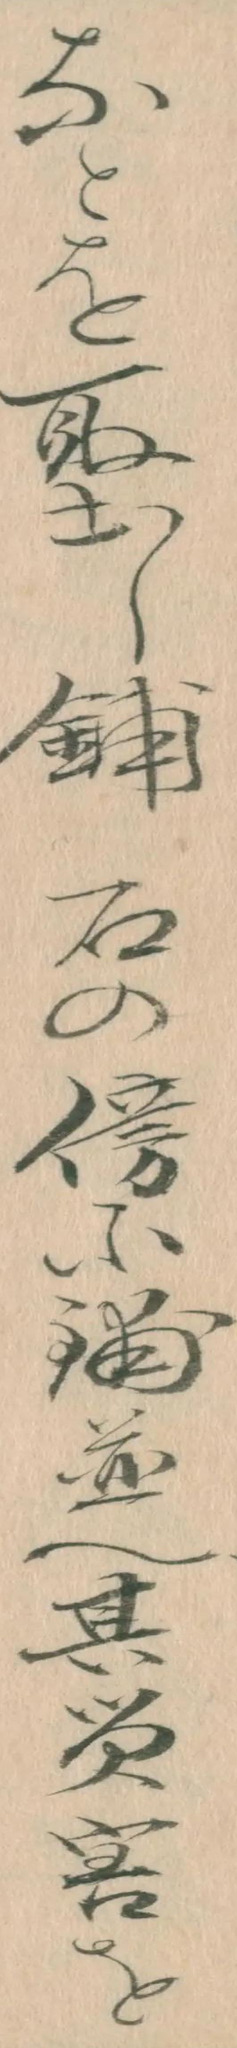なとを取出し鋪石の傍に鋪並へ其災害を
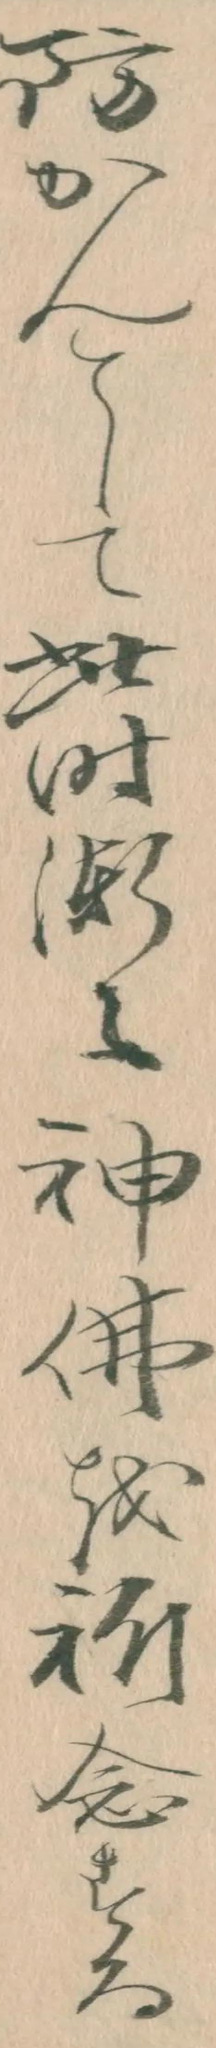防かんとして此時漸く神仏を祈念する
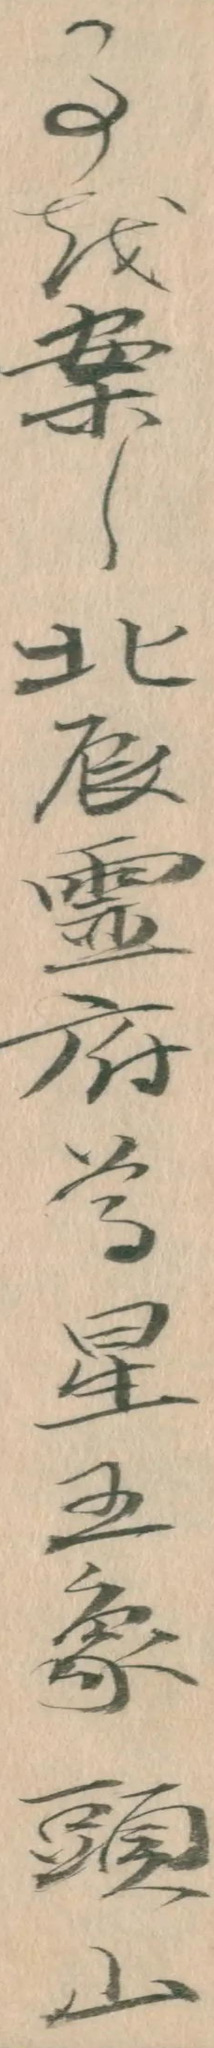事を案し北辰霊府尊星王象頭山
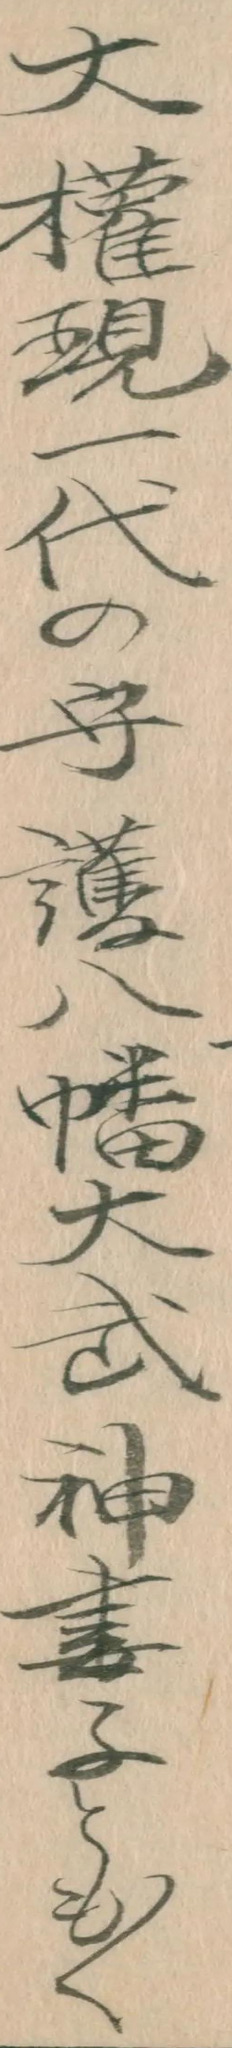大権現一代の守護八幡大武神妻子とも〳〵
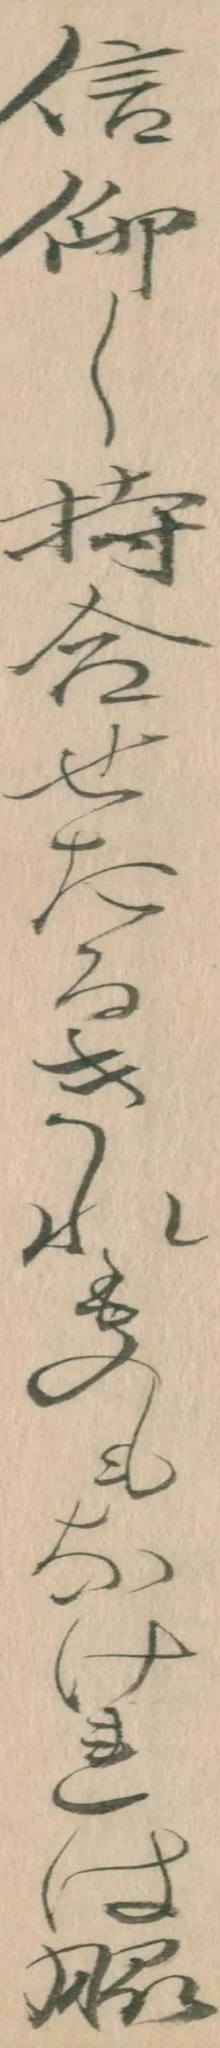信仰し持合せたるきれものもなけれは脇
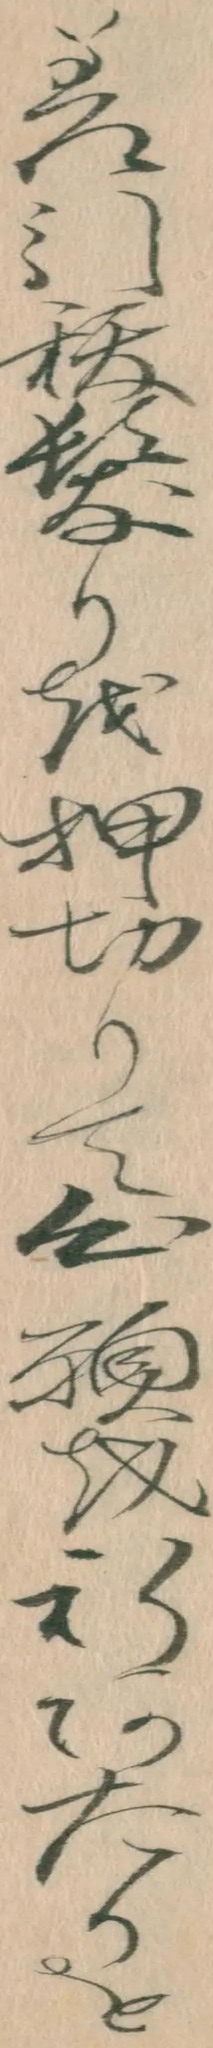差引抜髪りを押切りて本願を祈あたりを
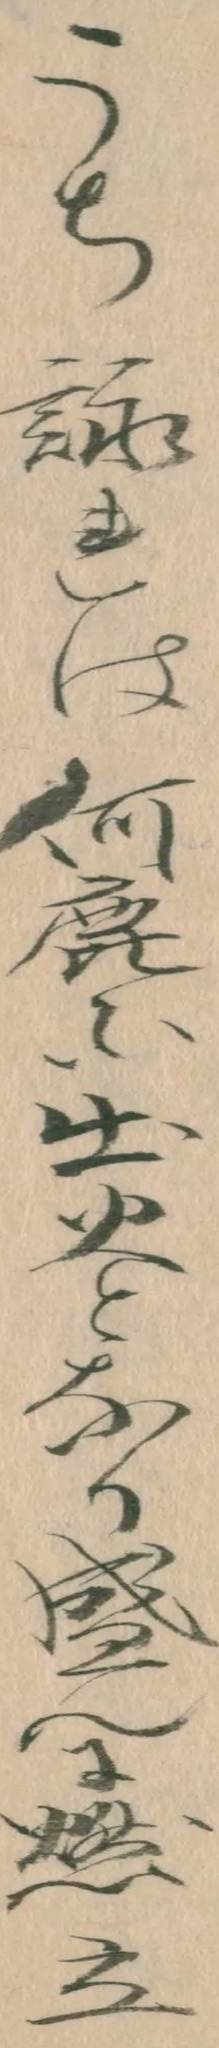うち詠れは何鹿に出火となり盛んに燃立
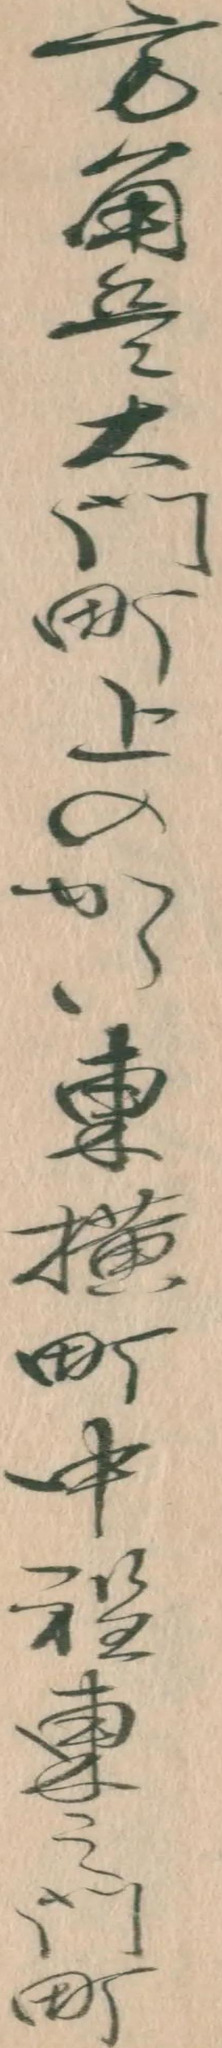方角は大門町上のかた東横町中程東之門町
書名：俗語之種. [3]
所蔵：国立国会図書館 National Diet Library, JAPAN
